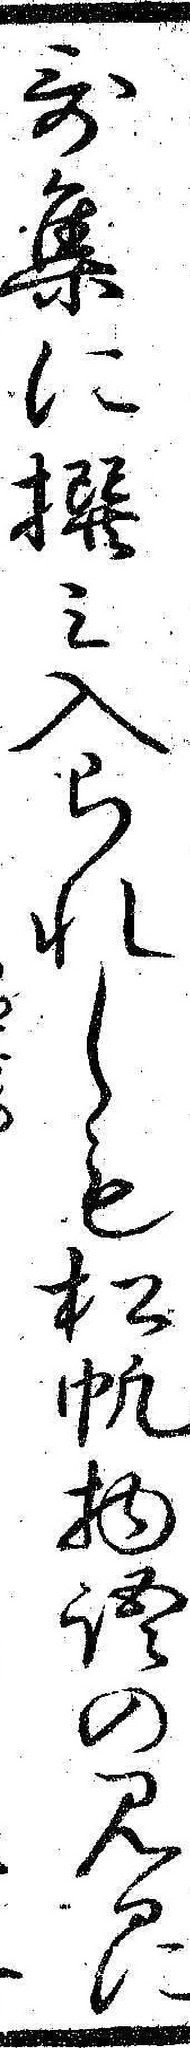哥集に撰み入られしも松帆物語の見るに
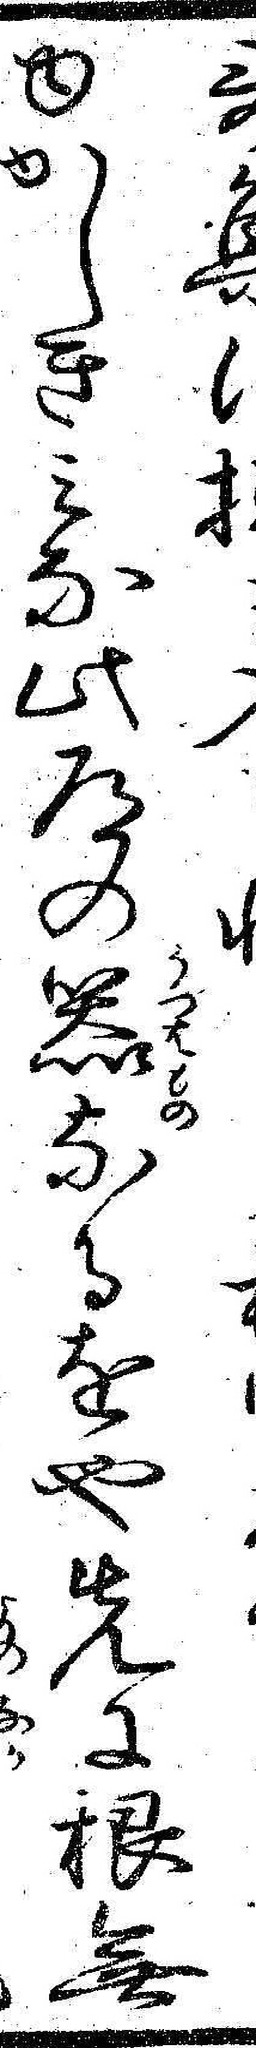ゆかしきみな此道の器なるをや先に根無
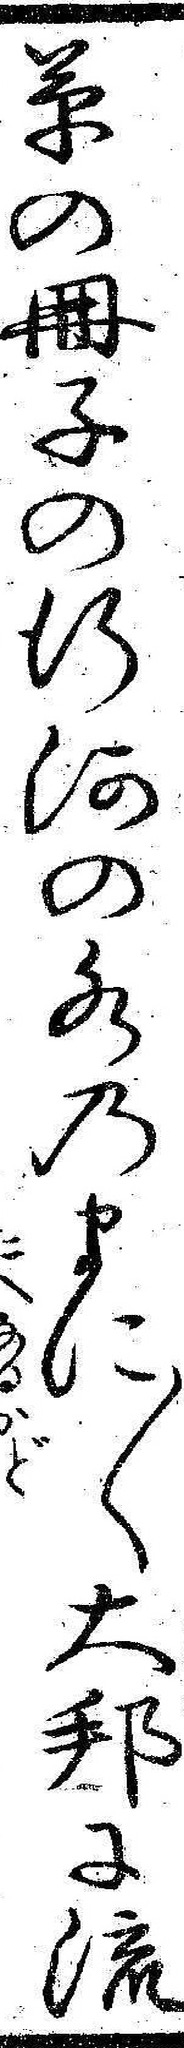草の冊子の行河の水のまに〱大邦に流
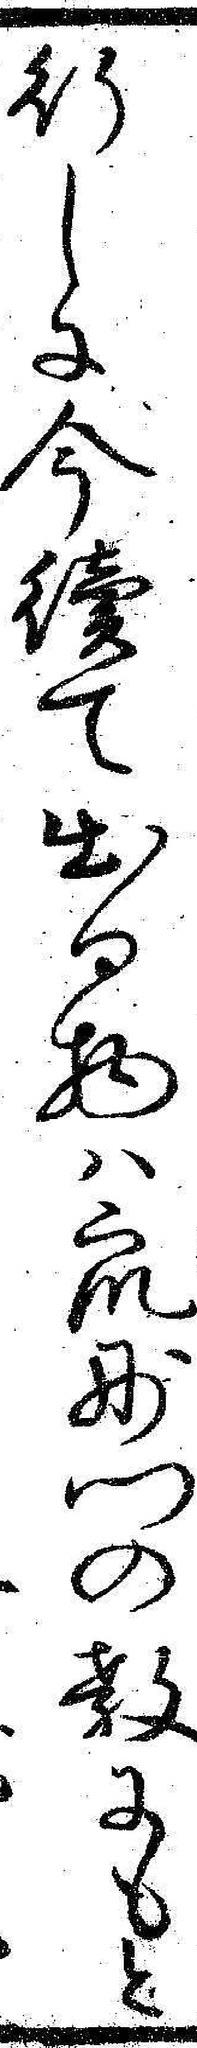行しに今続て出る物は衆妙門の教にもと
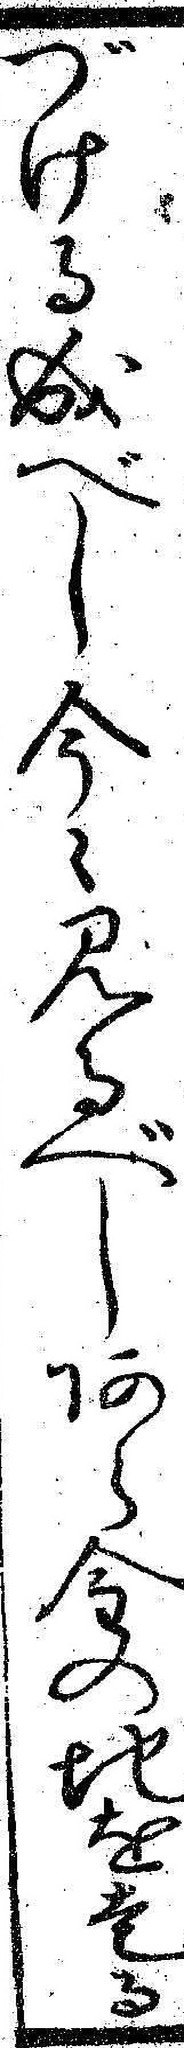づける成べし今々見るべしあら金の地を走る

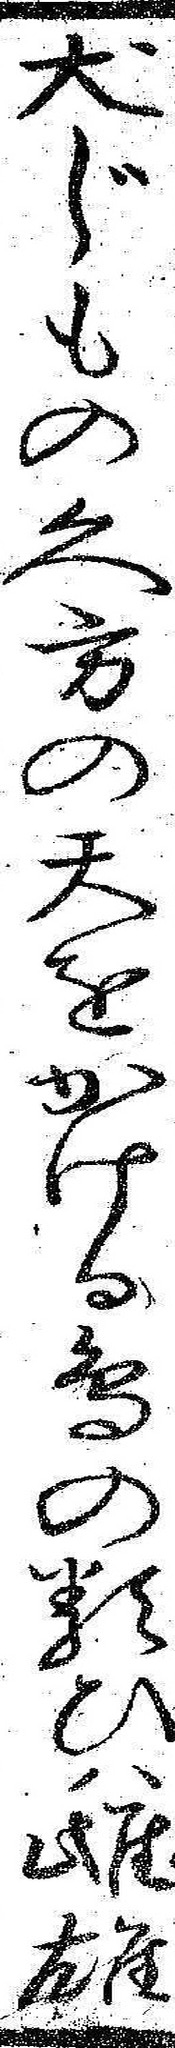犬じもの久方の天をかける鳥の類ひは雌雄
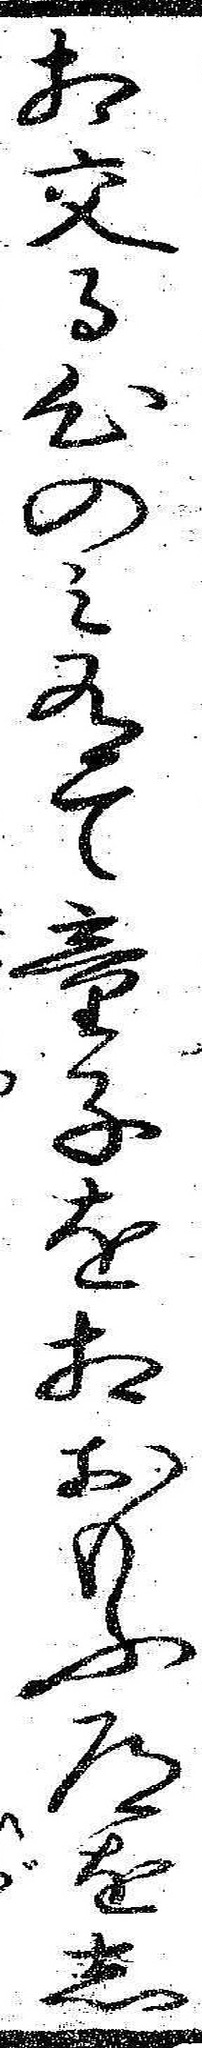相交る心のみ有て童子を相おもふ道をし
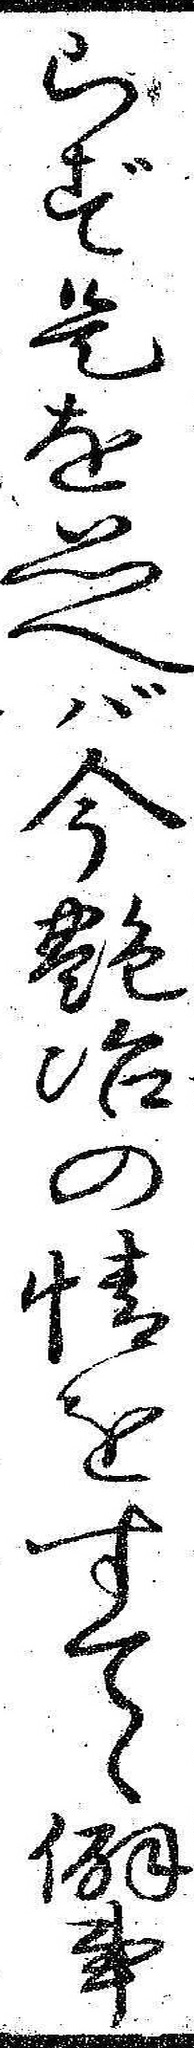らず是を思へば今艶冶の情をすてゝ僻事
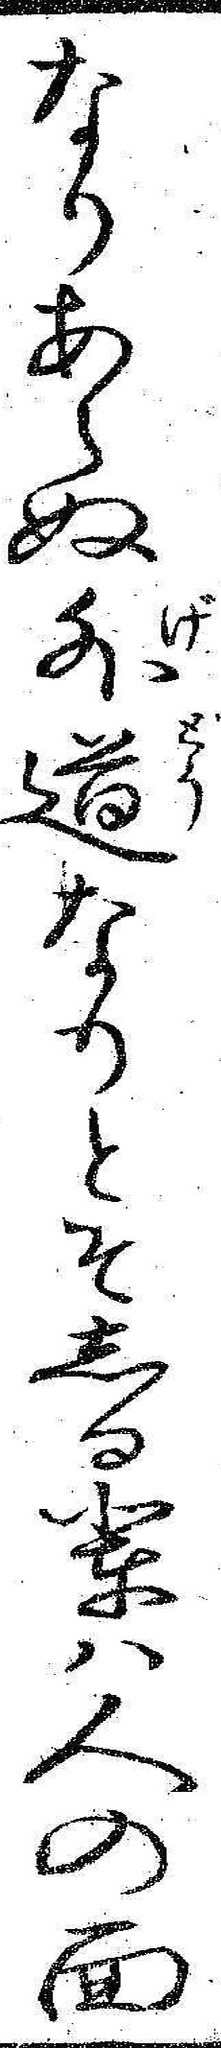なりあらぬ外道なりとそしる輩は人の面
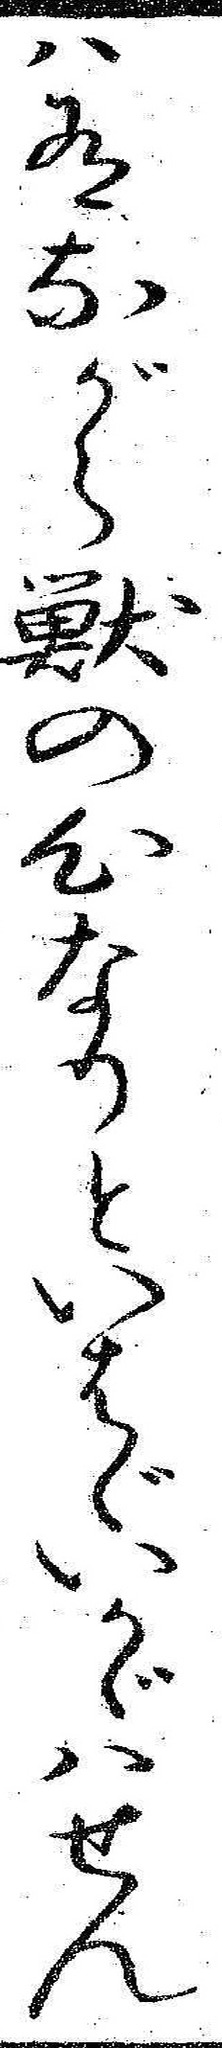は有ながら獣の心なりといはゞいかゞはせん
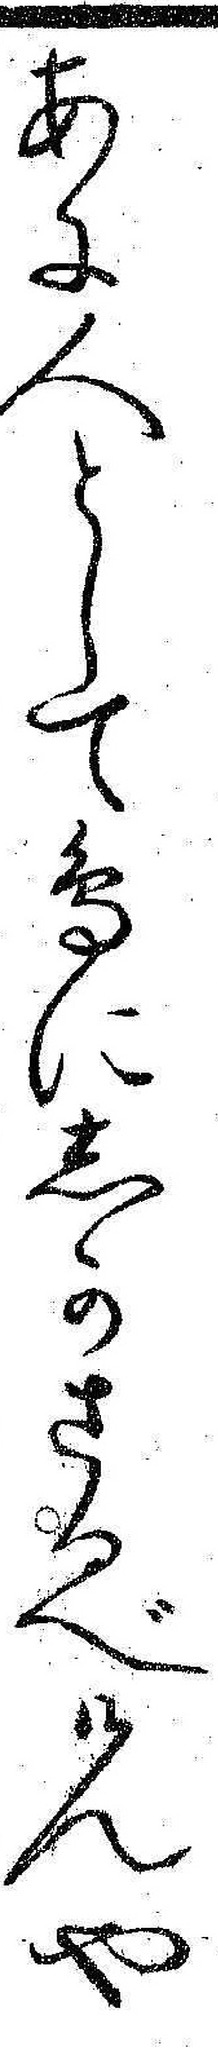あに人として鳥にしかさるべけんや
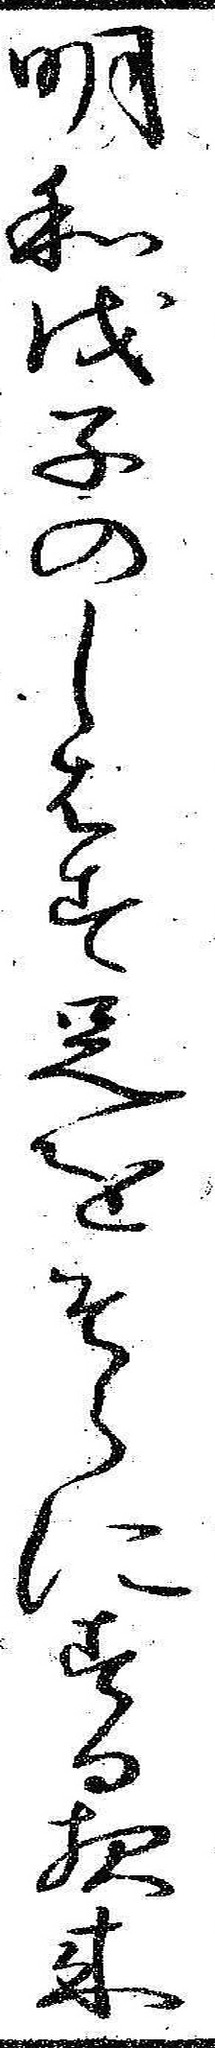明和戊子のしはす足をそらにする夜来
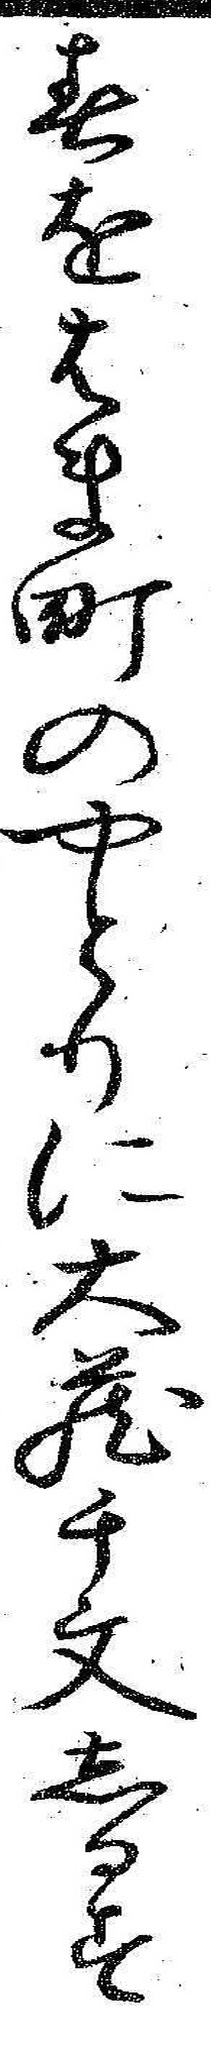春をはま町のやとりに大蔵千文しるす
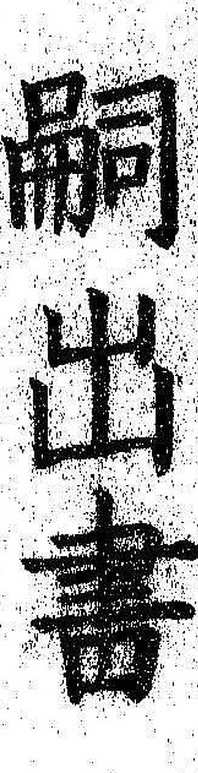嗣出書
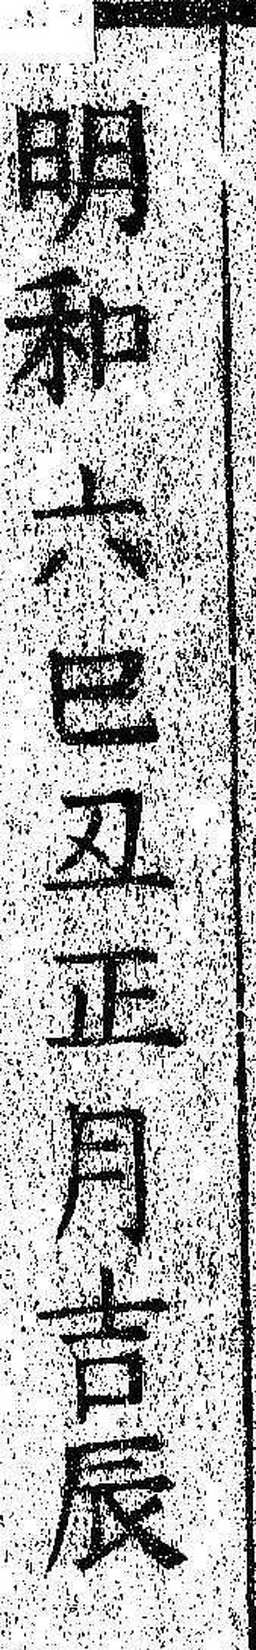明和六己丑正月吉辰
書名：根無草後編
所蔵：国文学研究資料館
